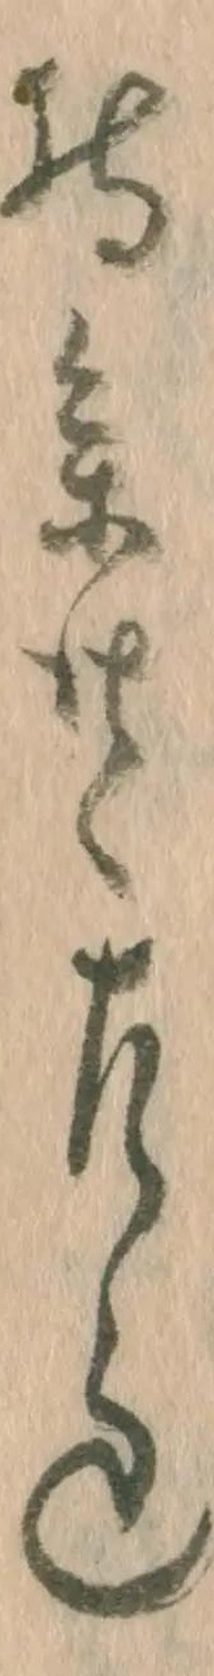持参仕候左之通
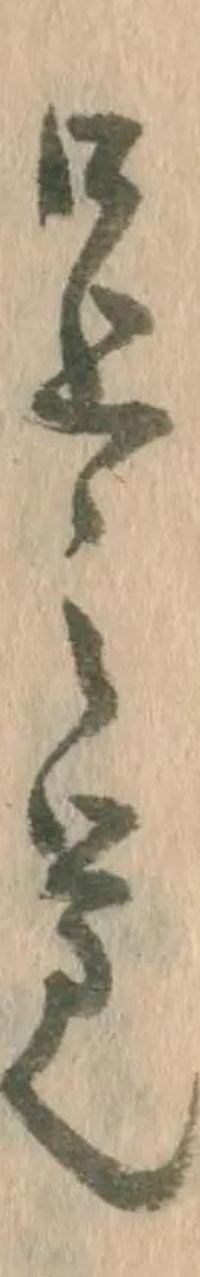口上之覚
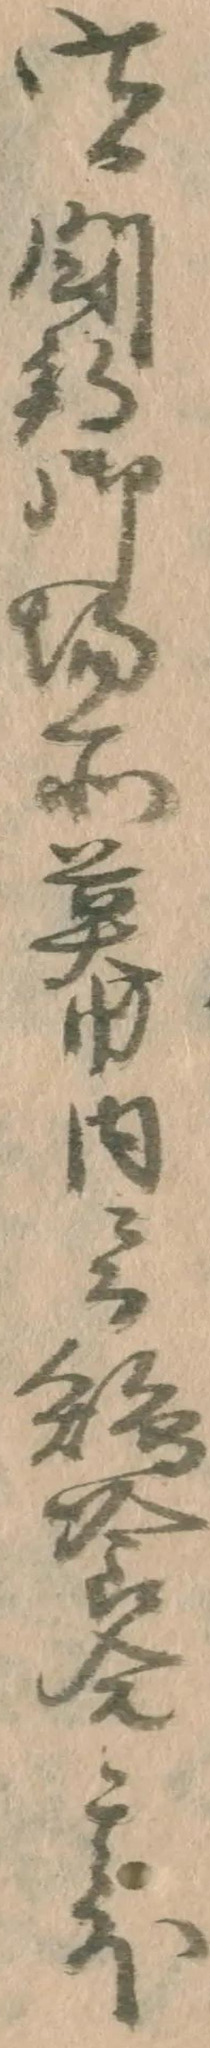昨日闘鶏御場所幕内ニ而鶏喰合其外
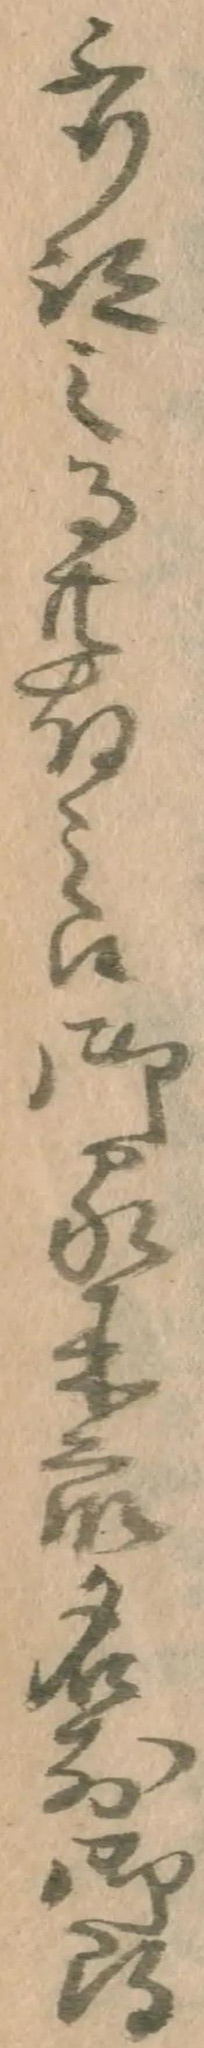不行跡之事共有之候御家来衆名前御尋

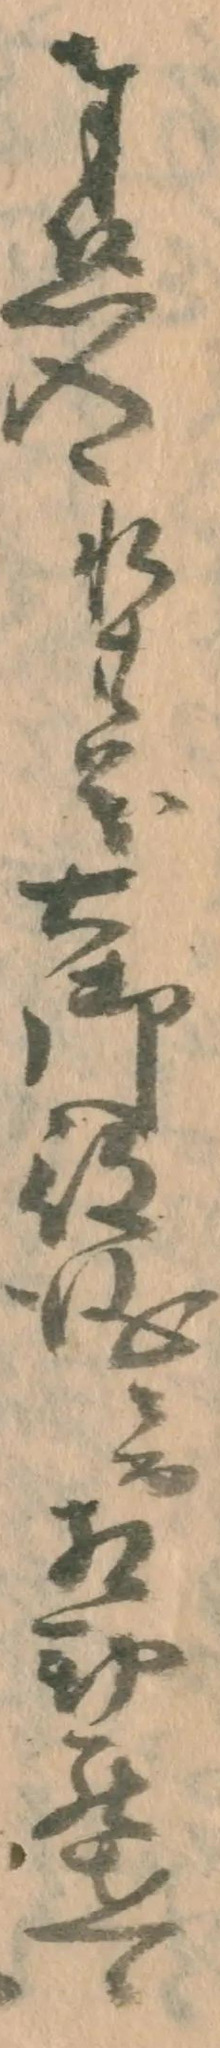奉恐入候私共義右御役儀ニ而相勤罷在候
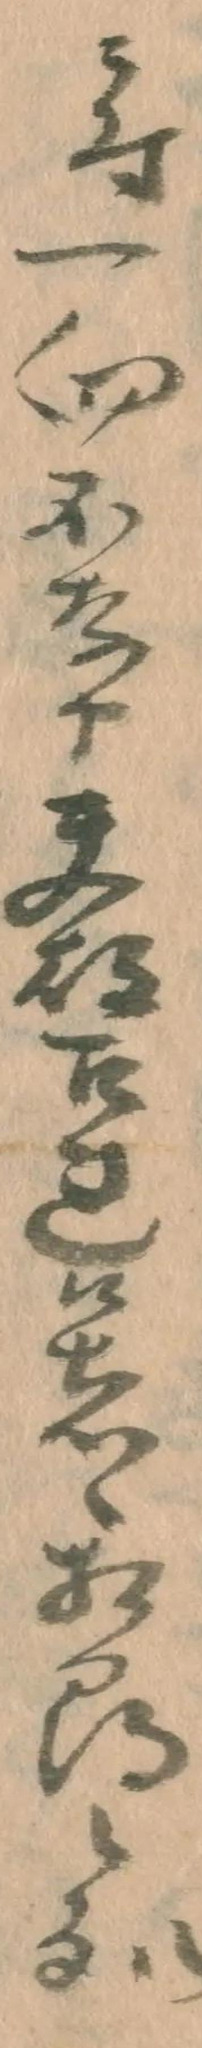ニ付一向不存申夫故召連候者へ相尋候処
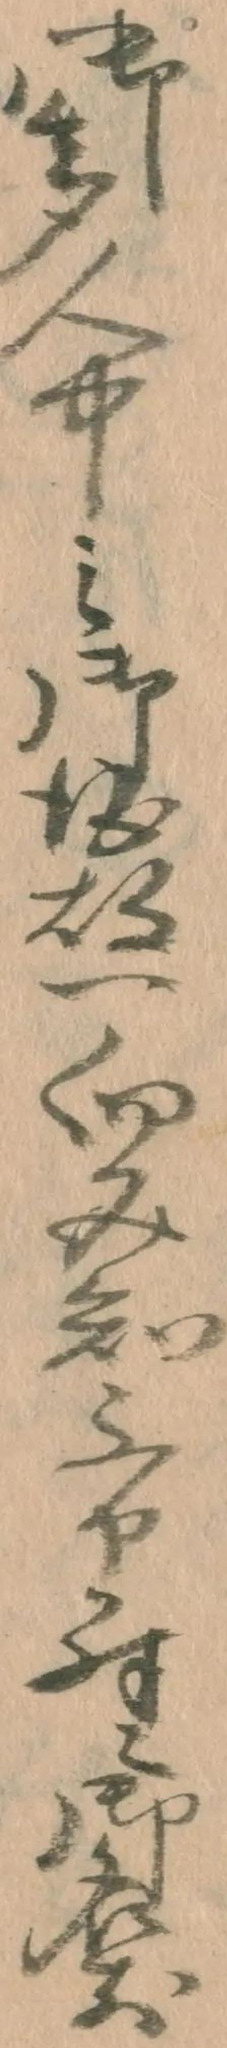御多人中之御儀故一向み知不申候時ニ御名前
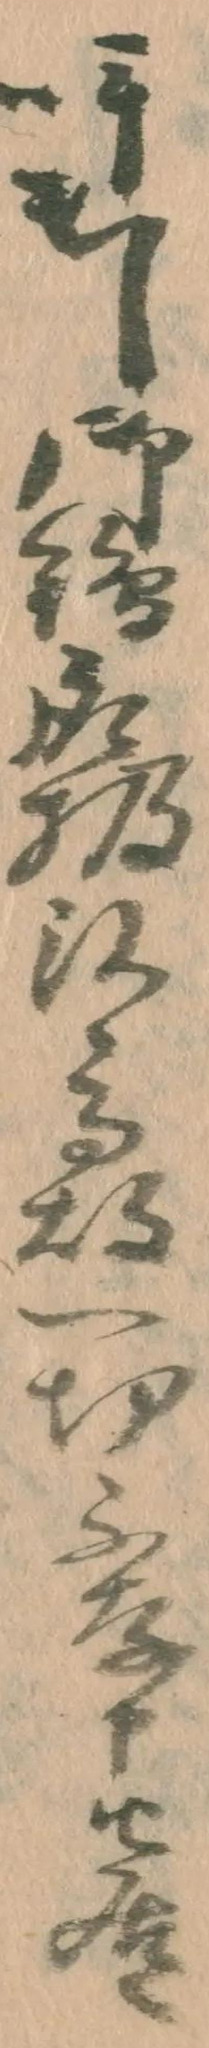呼出し御鶏取扱致候事故一切不存申居候
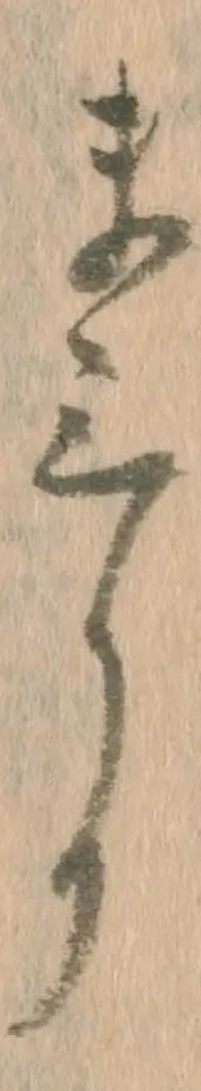未三月
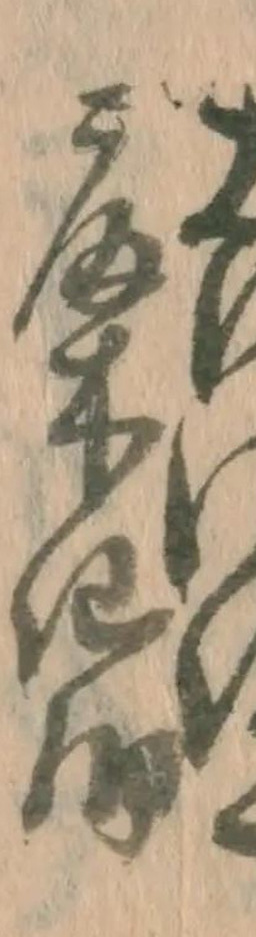藤木仙納
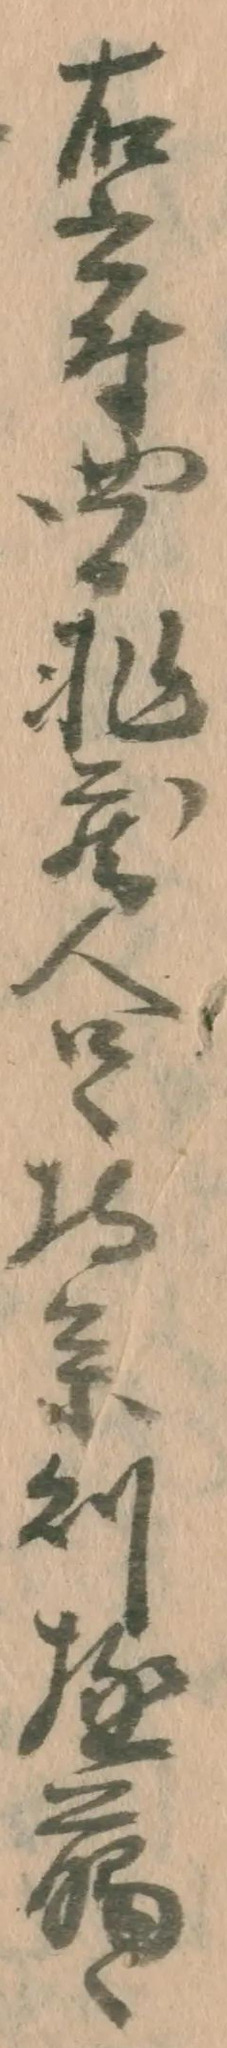右書付四日非蔵人口へ持参則極臈へ
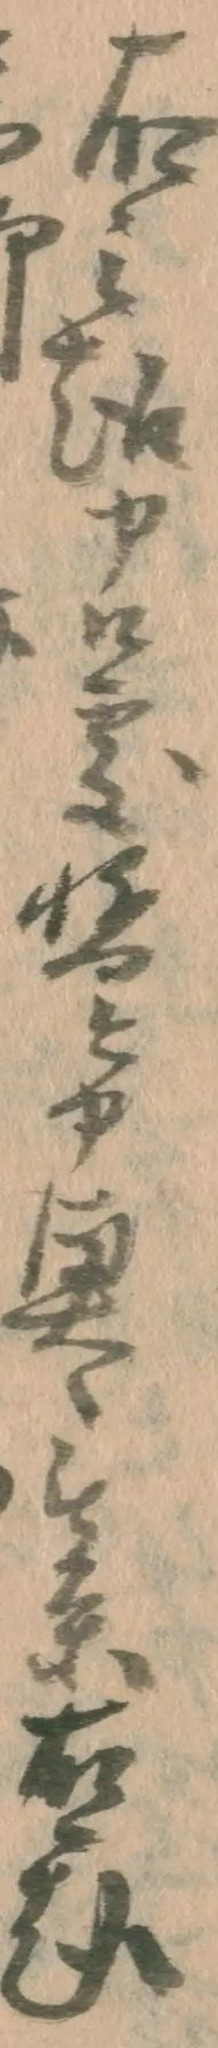右之趣申候処暫と申奥へ被参右之趣
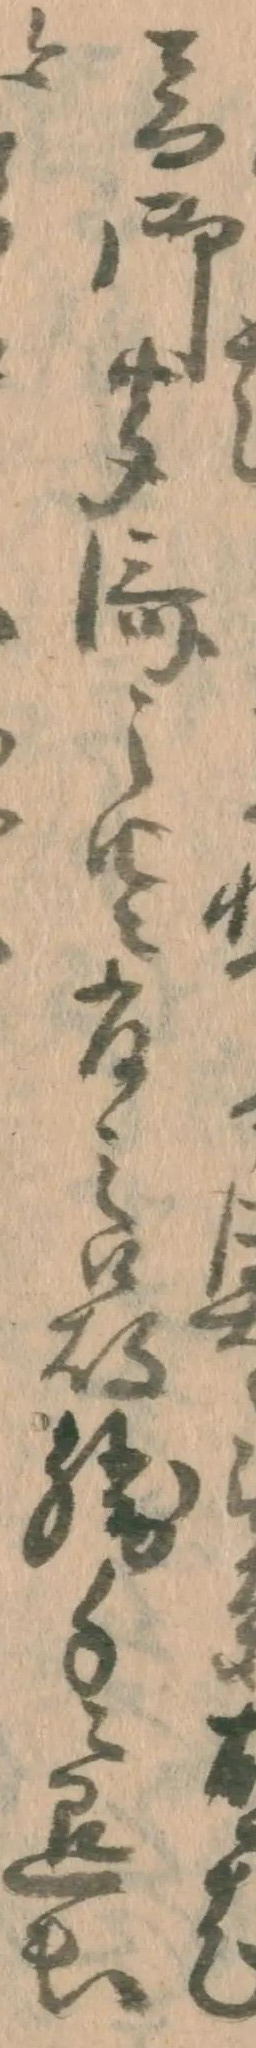ニ而御聞済之由ニ有之候故勝手ニ退出
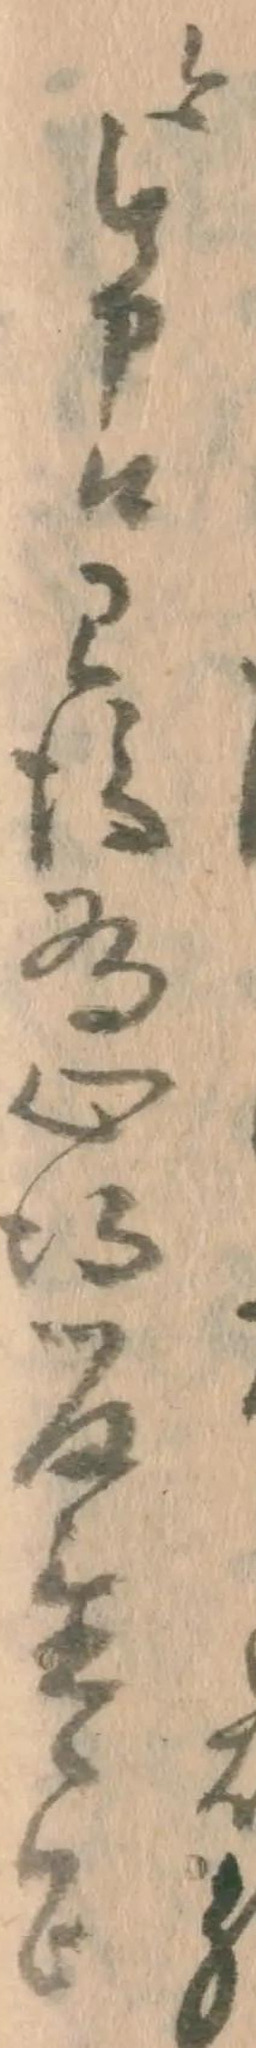と被申候已後為心得留置候以上

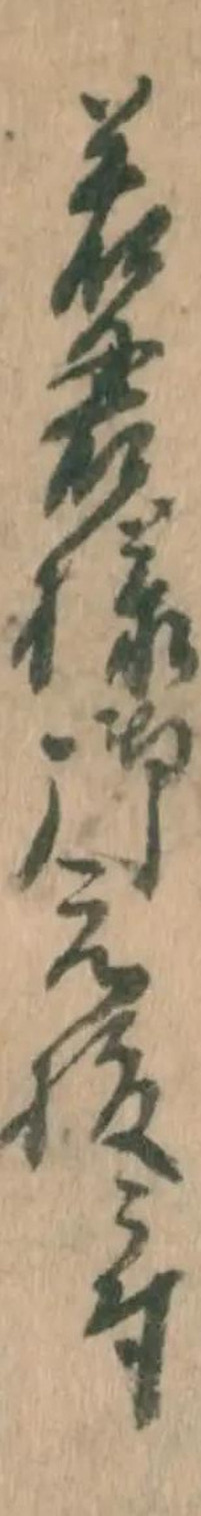若君様御元服ニ付
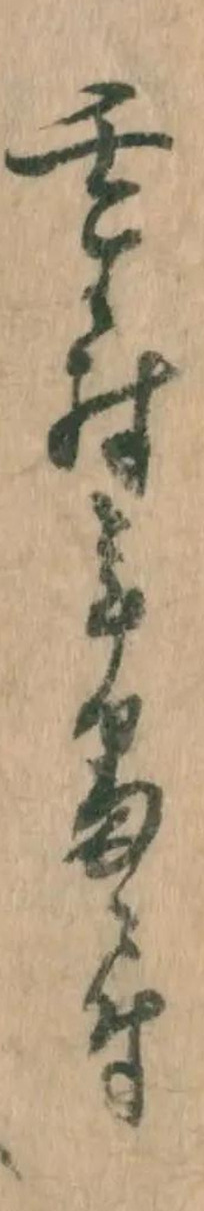壬生村年番ニ付
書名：賀茂社記録. 第61冊
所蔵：国立国会図書館 National Diet Library, JAPAN
